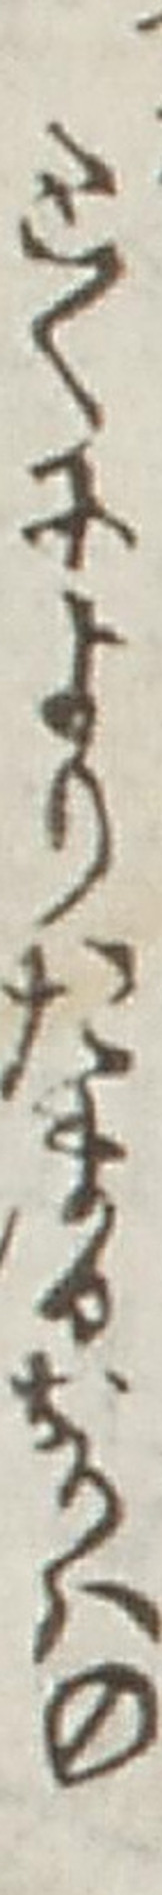みくによりたまるおかはの
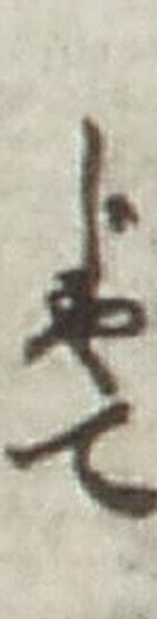じやて
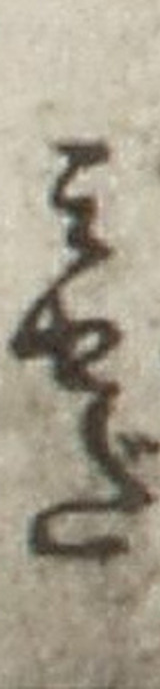みせだ

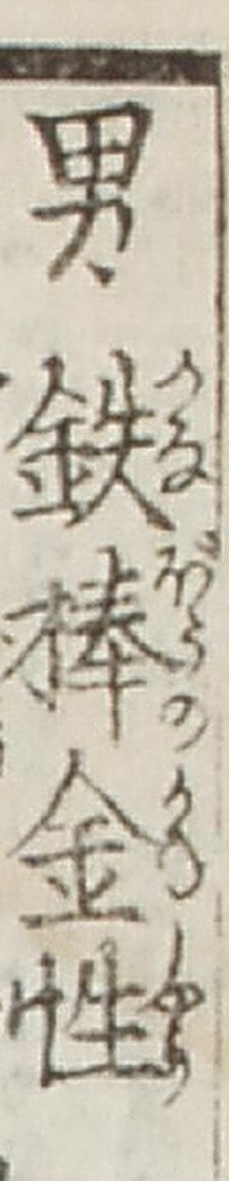男鉄棒金性
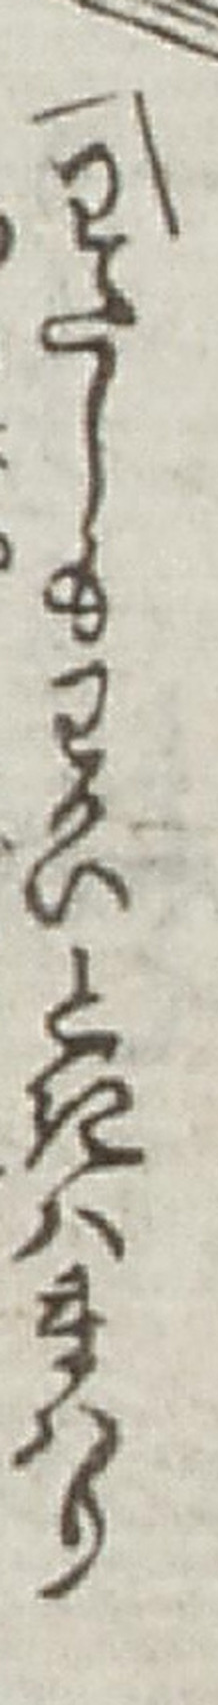〽わたしもわかいときはまはり
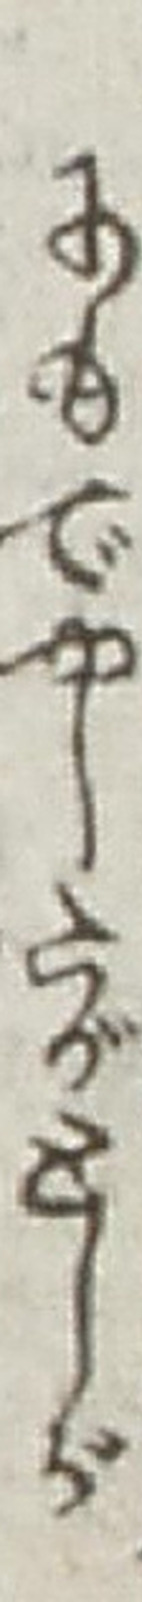にもでやしたがとしが
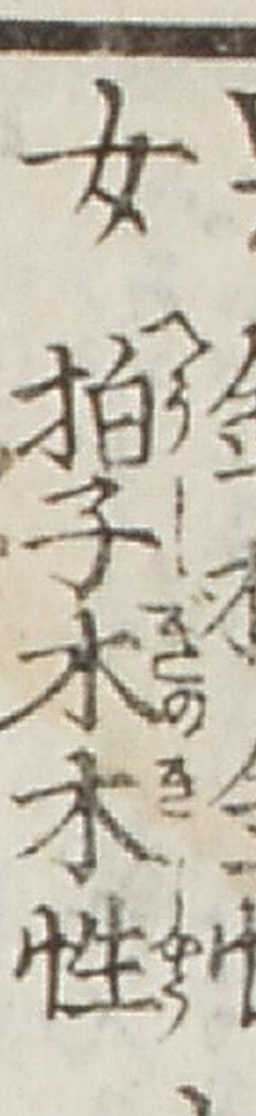女拍子木木性吉
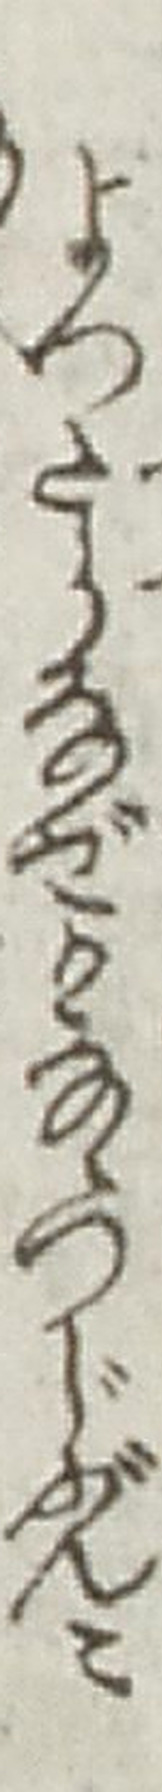よつたらなぜかなゝつじぶんに
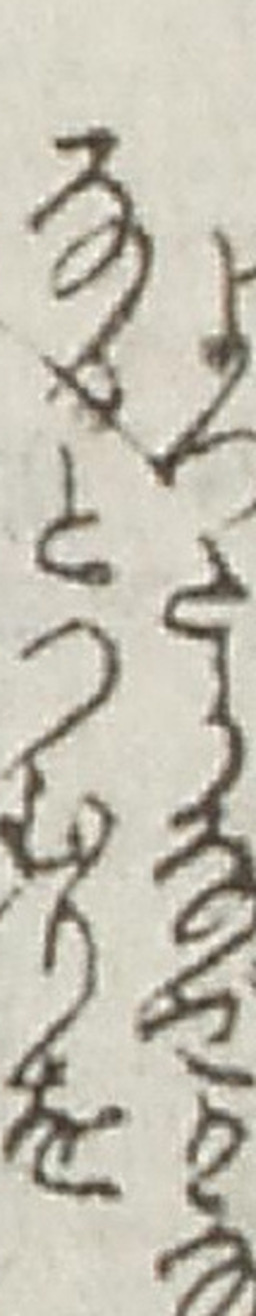なるとつむりを
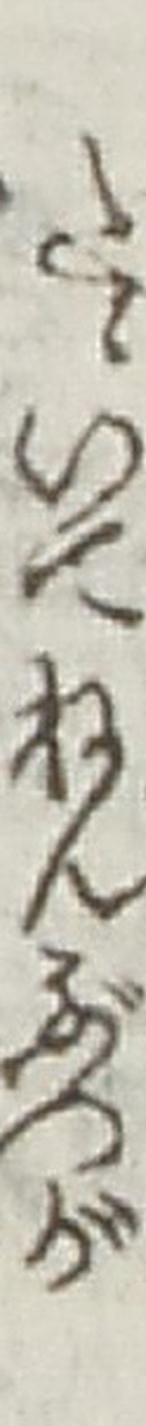たゝいてねんぶつが
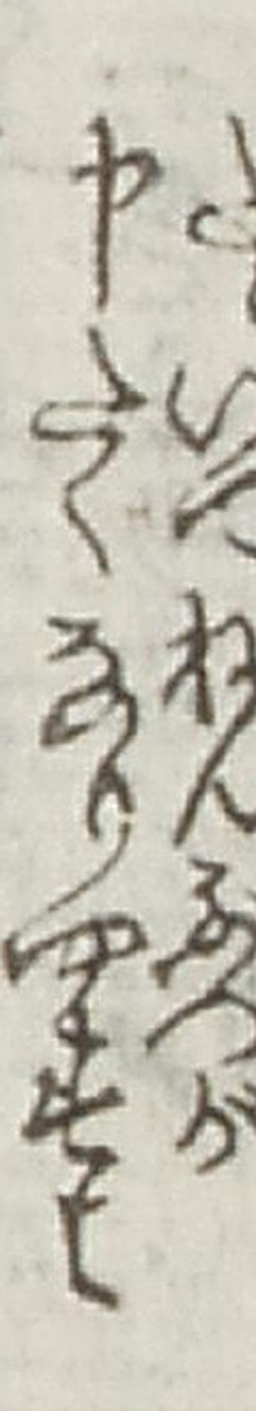申たくなりやすし
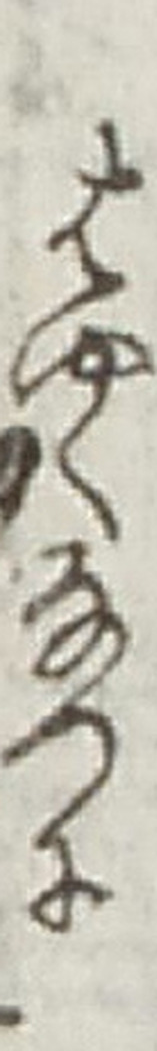はやくなつに
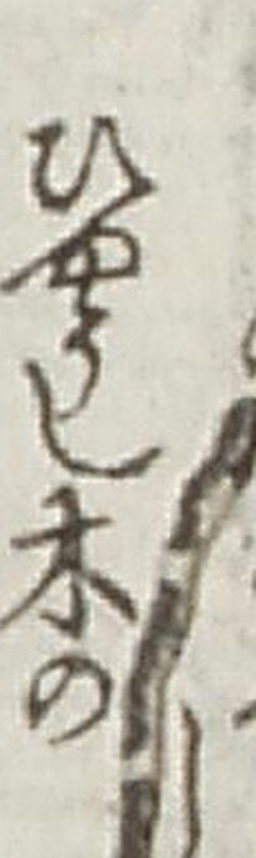ひやうし木の
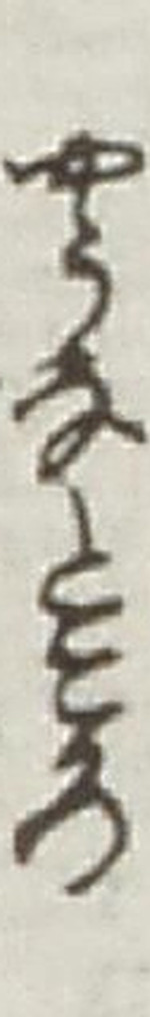やうなところ
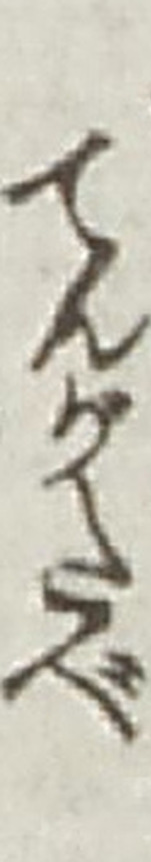てんがたべ
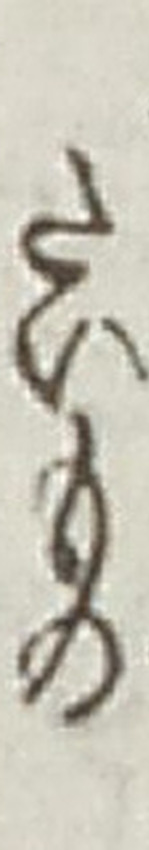たいもの
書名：三世相出雲當座帳　上下冊
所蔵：東京大学地震研究所図書室 Earthquake Research Institute Library, The University of Tokyo, JAPAN
